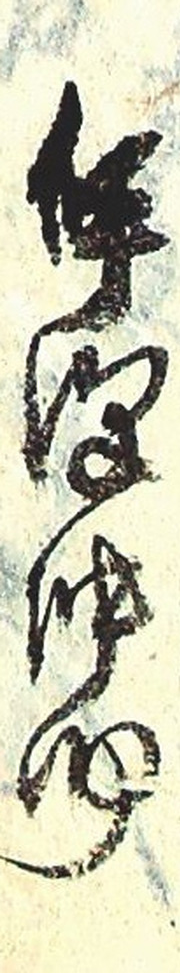伊沢仲助
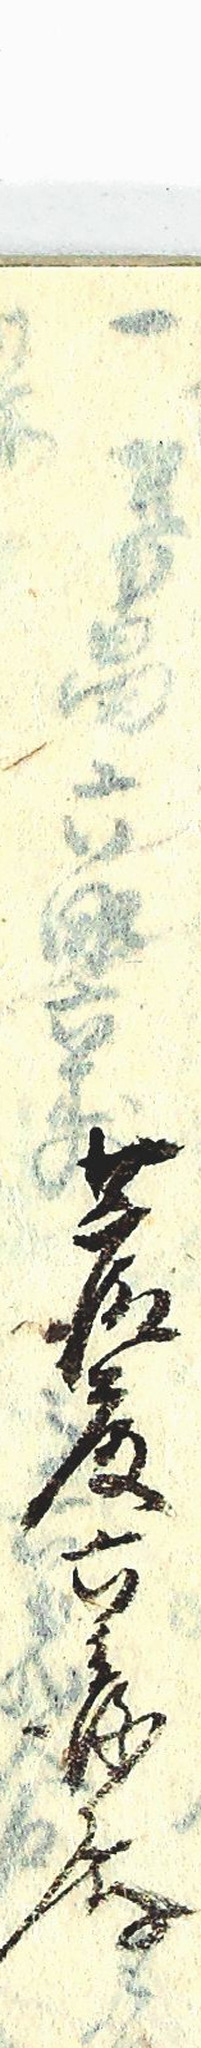菅藤六兵衛殿
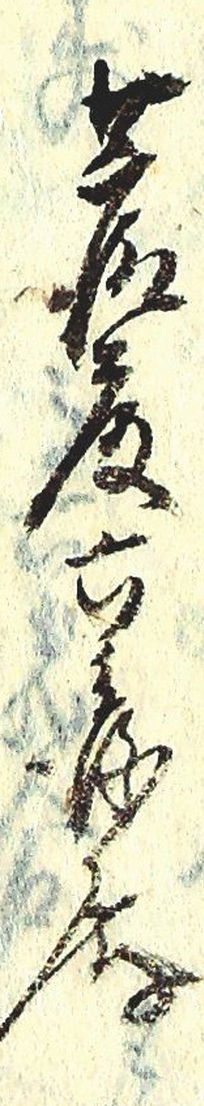菅藤六兵衛殿
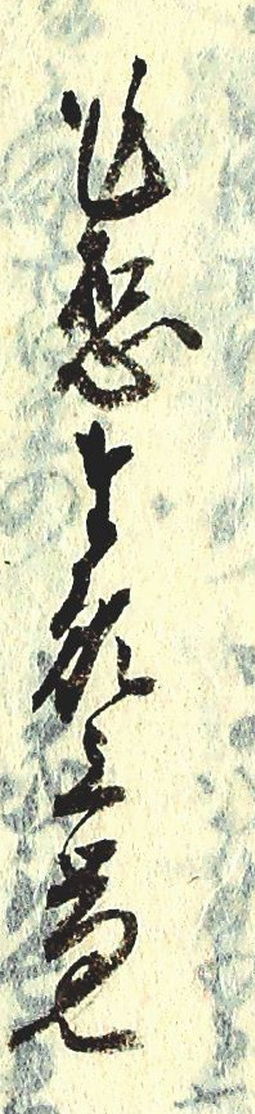乍恐奉願上覚
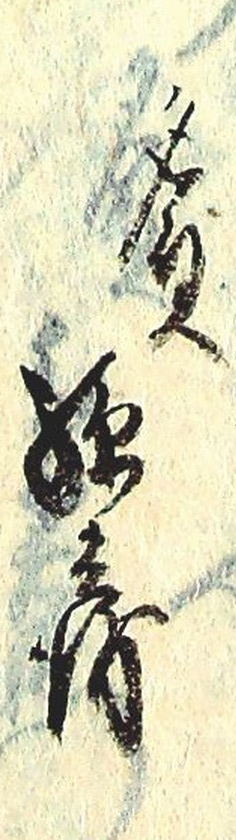利兵衛
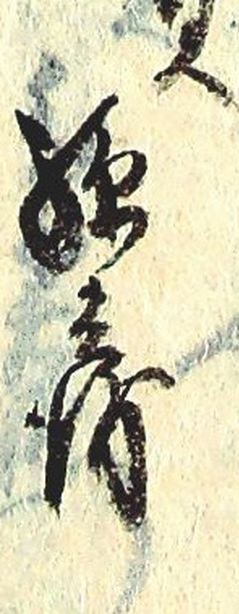利兵衛
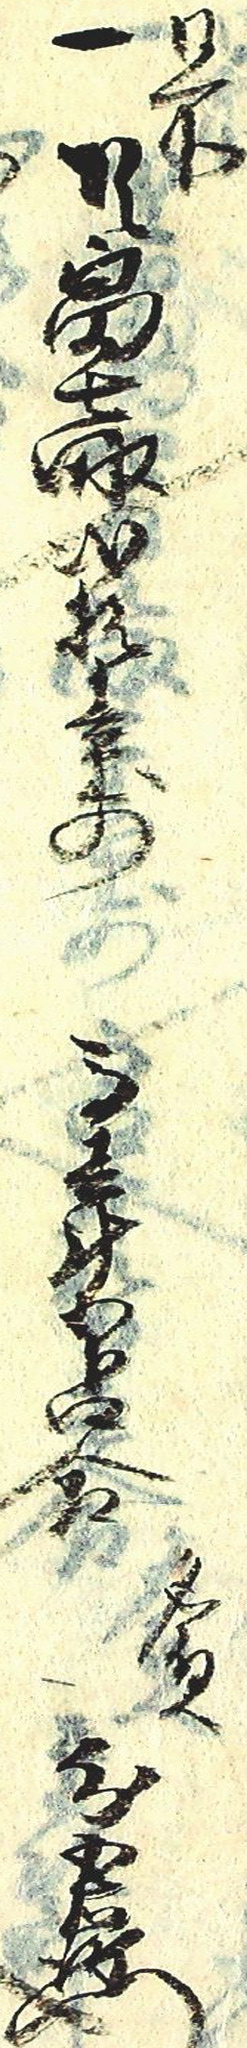一下々畠七畝弐拾壱歩高壱斗五升四合分五右衛門
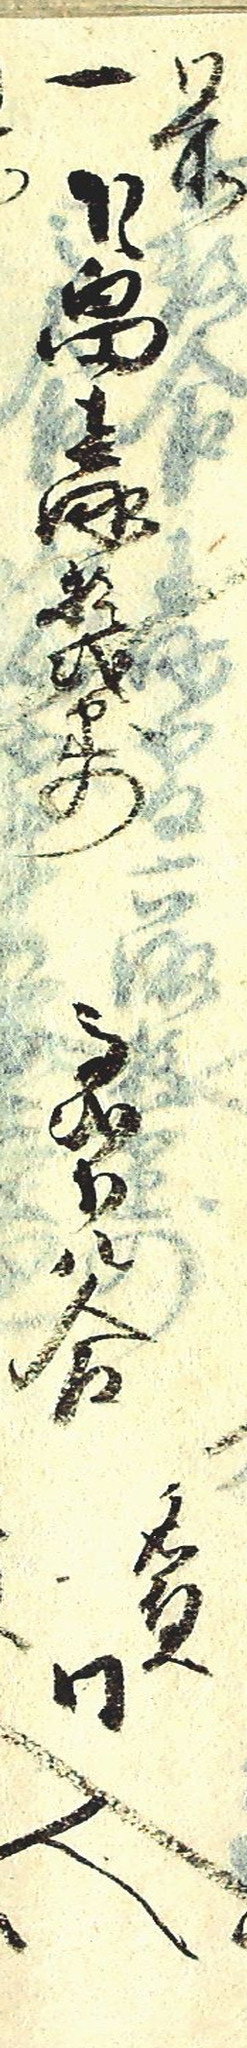一下々畠壱畝拾弍歩高弐升八合同人
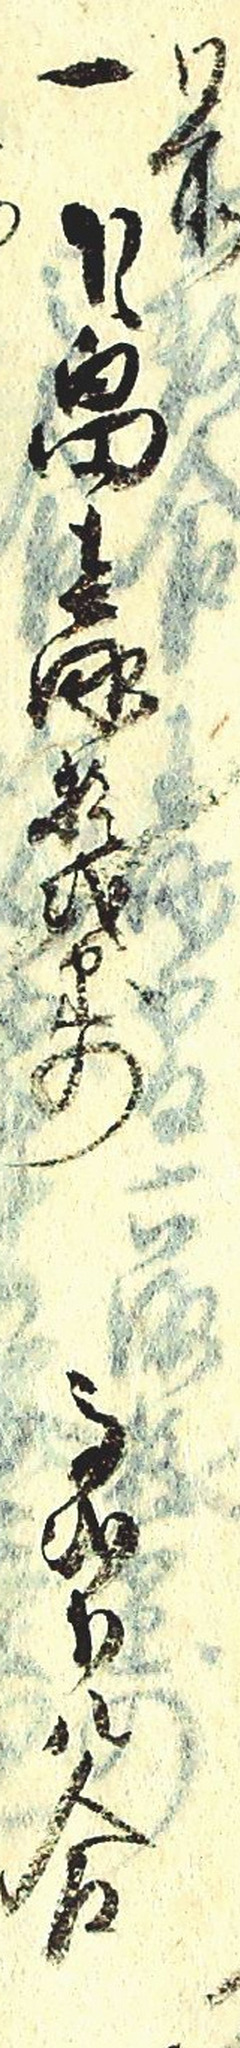一下々畠壱畝拾弍歩高弐升八合同人
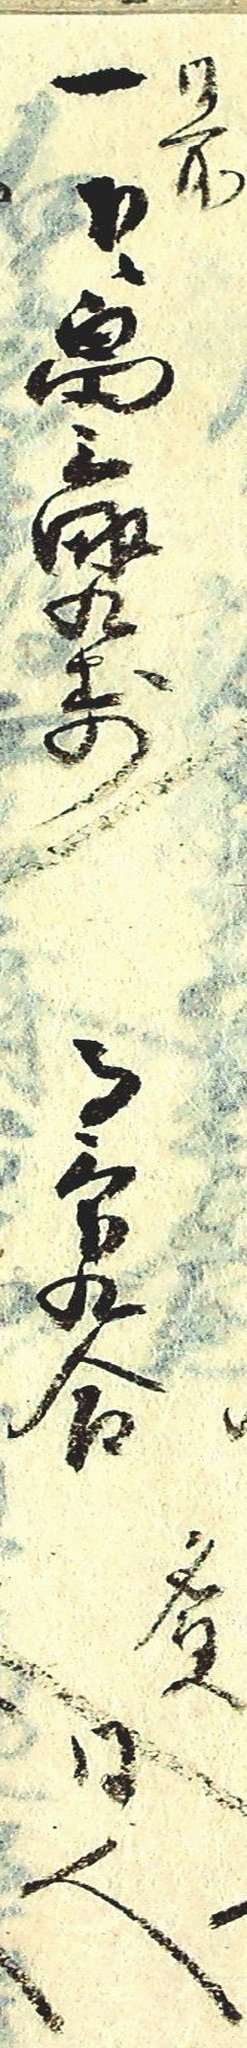一下々畠三畝九歩高三升九合同人
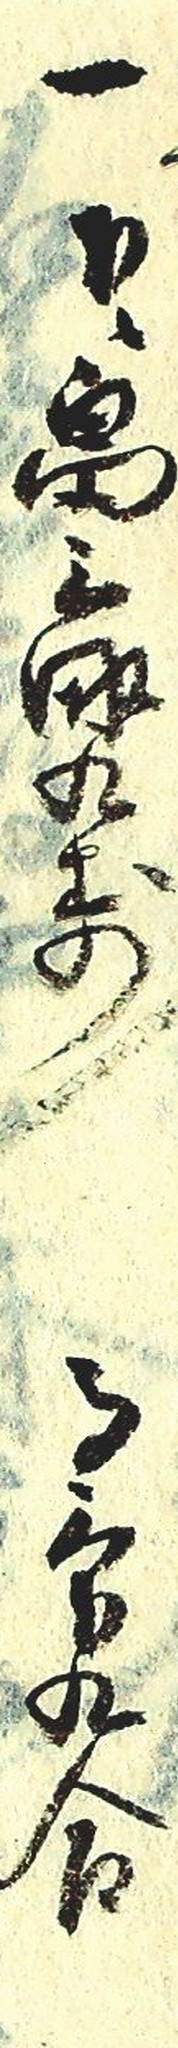一下々畠三畝九歩高三升九合同人
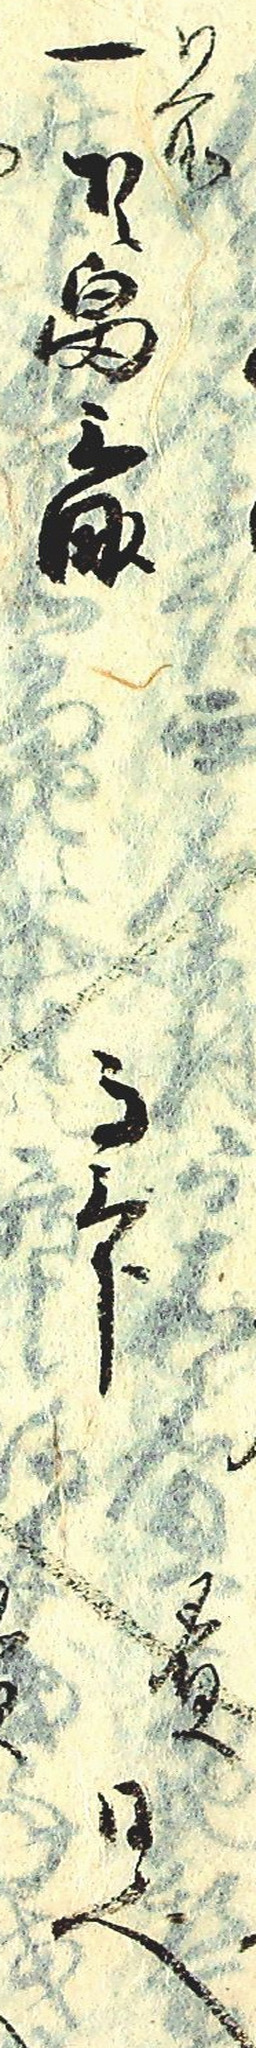一下々畠三畝高三升同人
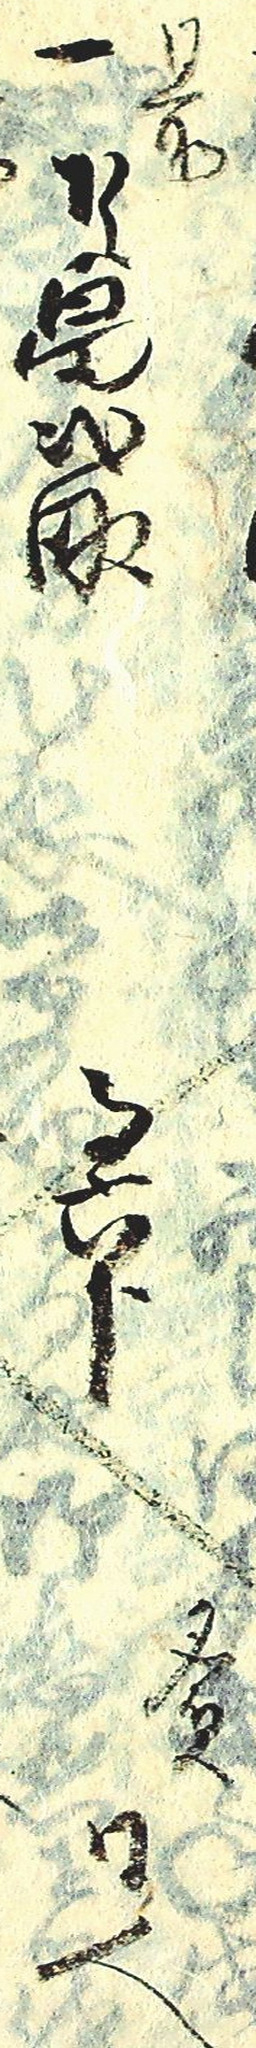一下々畠弐畝高六升同人
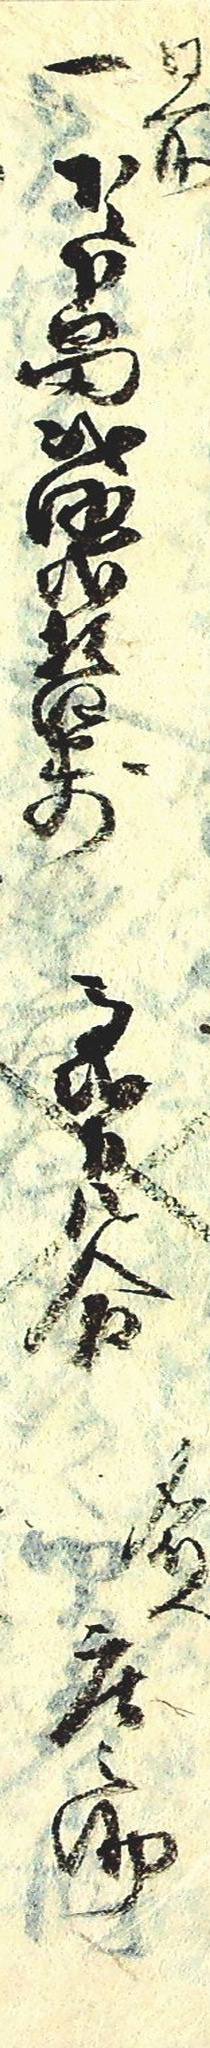一下々下畠弐畝弐拾四歩高弐升八合庄之助
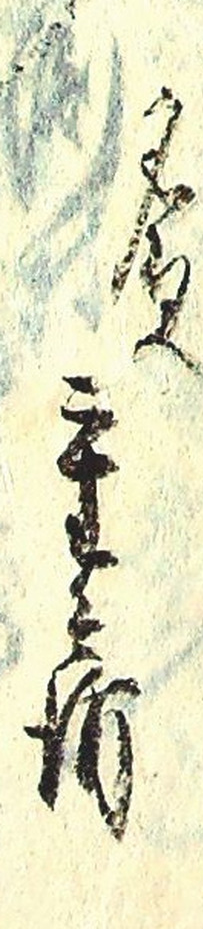利兵衛
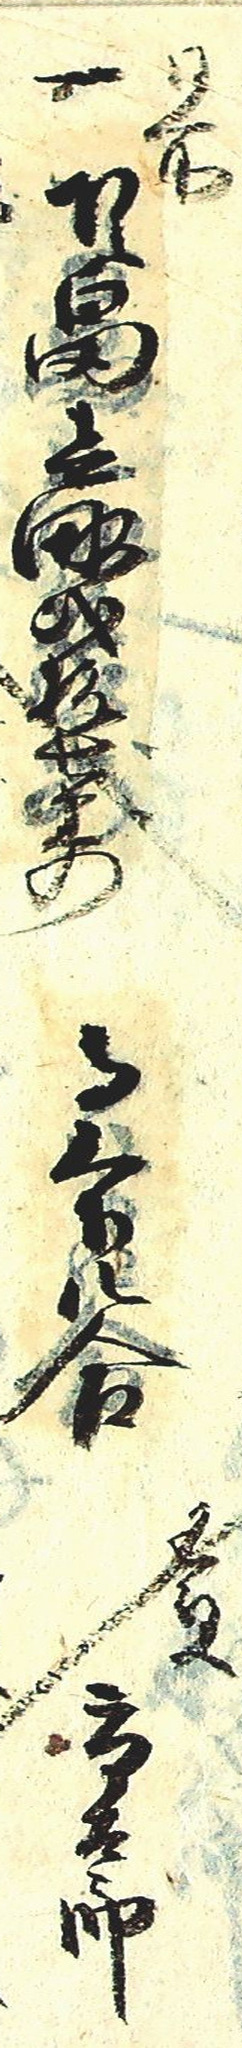一下々畠壱畝弐拾七歩高三升八合市太郎
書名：諸御願書控(弐番）
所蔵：鳴門教育大学 Naruto University of Education
